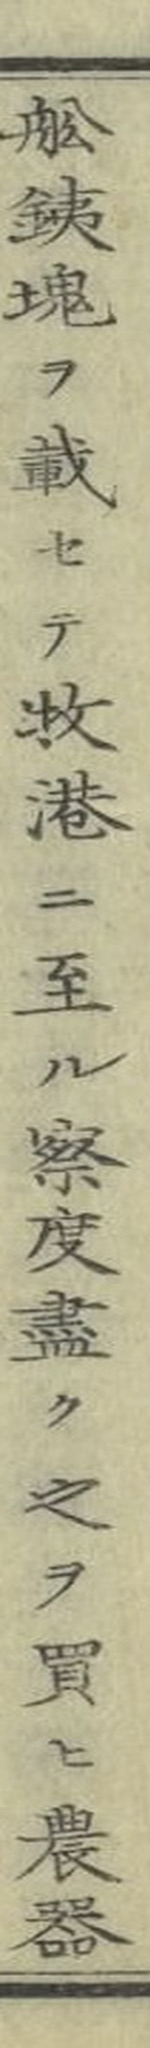舩銕塊ヲ載セテ牧港ニ至ル察度盡ク之ヲ買ヒ農器
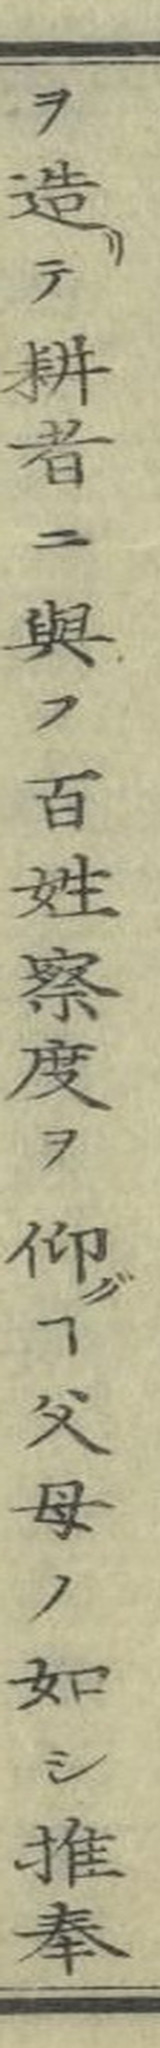ヲ造テ耕者ニ與フ百姓察度ヲ仰コト父母ノ如シ推奉
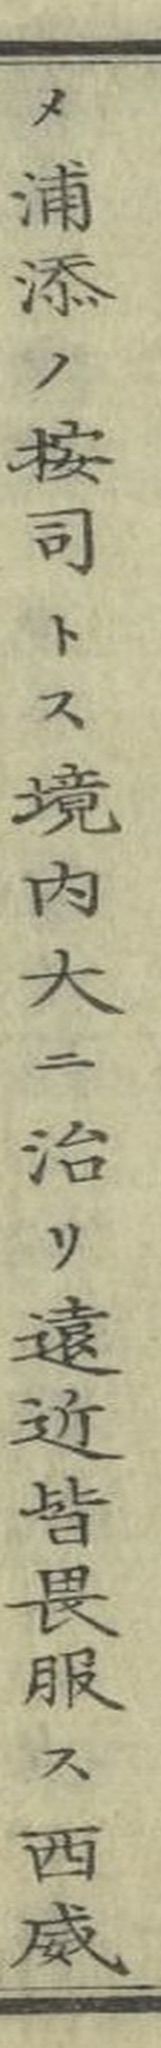シテ浦添ノ按司トス境内大ニ治リ遠近皆畏服ス西威
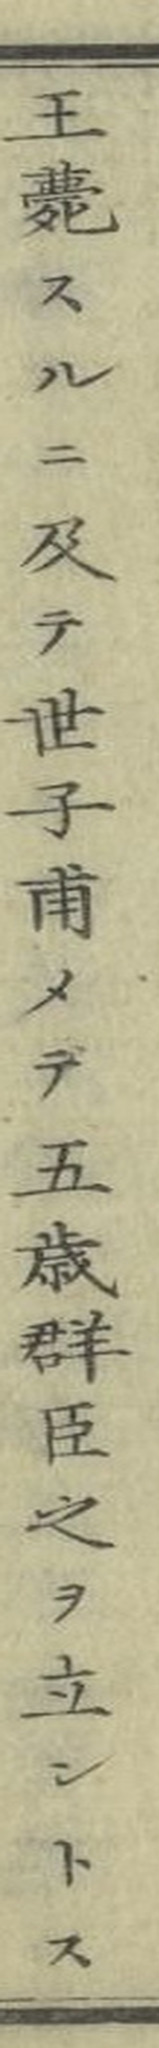王薨スルニ及テ世子甫メテ五歳群臣之ヲ立ントス
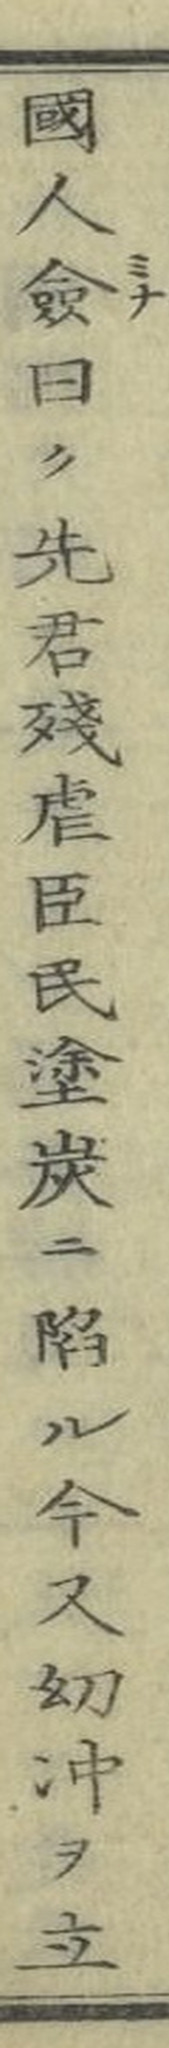國人僉曰ク先君殘虐臣民塗炭ニ陥ル今又幼冲ヲ立

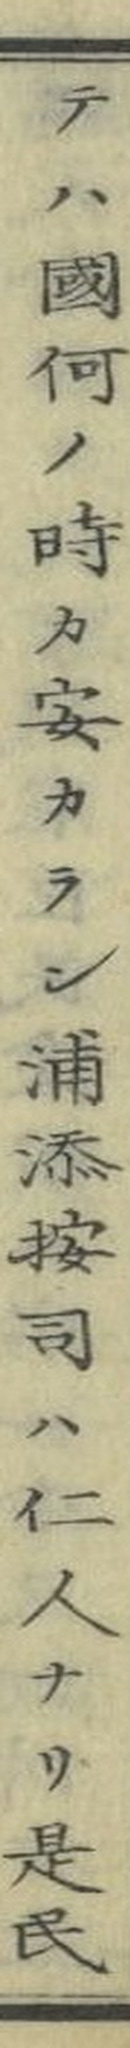テハ國何ノ時カ安カラン浦添按司ハ仁人ナリ是民
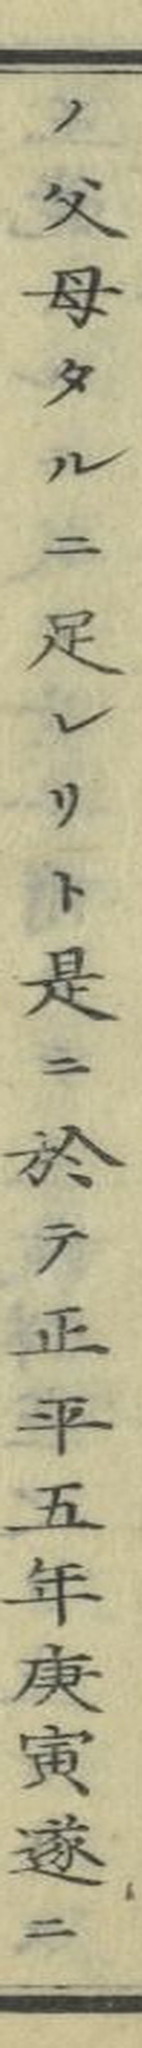ノ父母タルニ足レリト是ニ於テ正平五年庚寅遂ニ
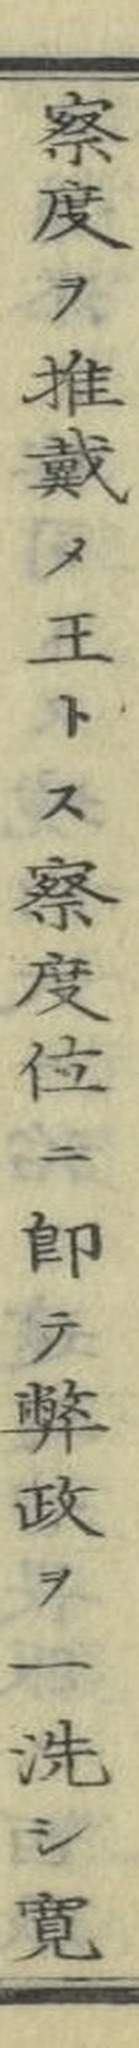察度ヲ推戴シテ王トス察度位ニ即テ弊政ヲ一洗シ寛
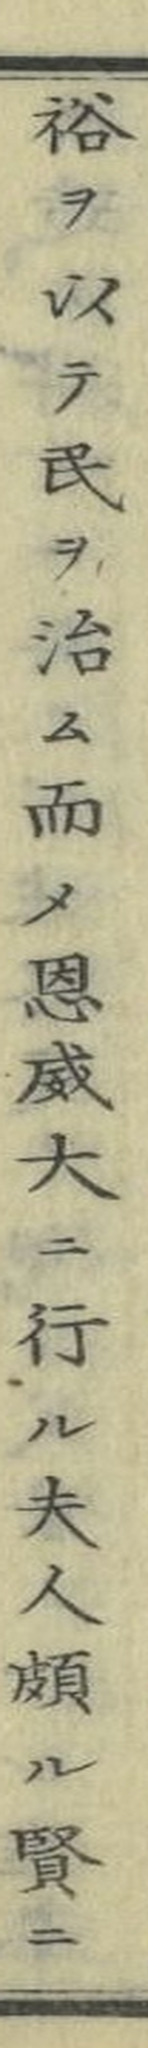裕ヲ以テ民ヲ治ム而シテ恩威大ニ行ル夫人頗ル賢ニ
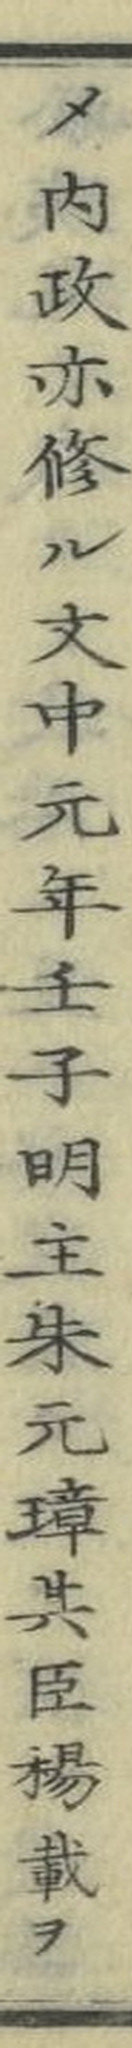シテ内政亦修ル大中元年壬子明主朱元璋其臣楊載ヲ
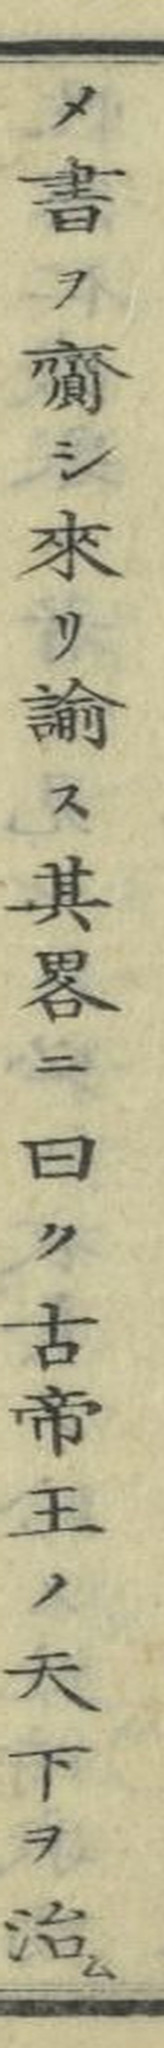シテ書ヲ齋シ來リ論ス其畧ニ曰ク古帝王ノ天下ヲ治
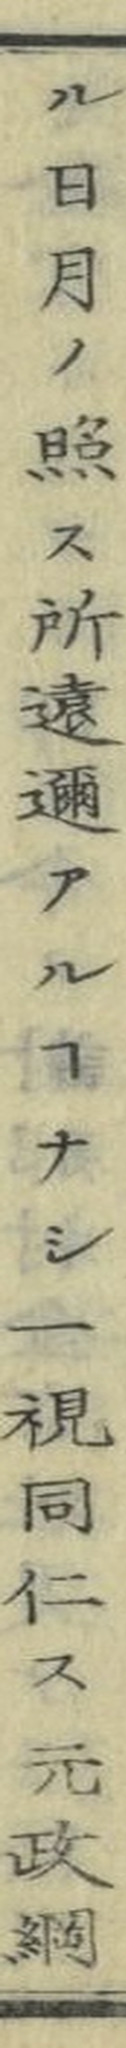ル日月ノ照ス所遠邇アルコトナシ一視同仁ス元政綱
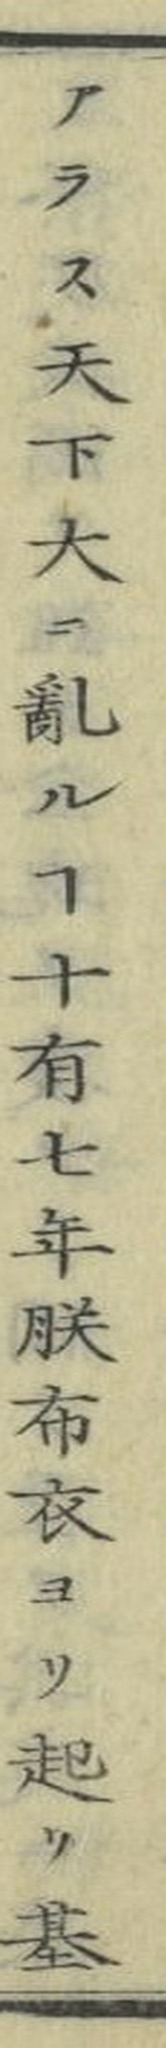アラス天下大ニ亂ルコト十有七年朕布衣ヨリ起リ基
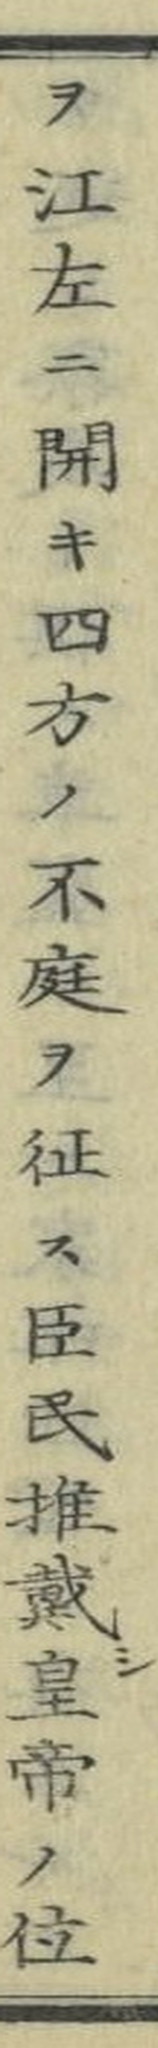ヲ江左ニ開キ四方ノ不庭ヲ征ス臣民推戴皇帝ノ位
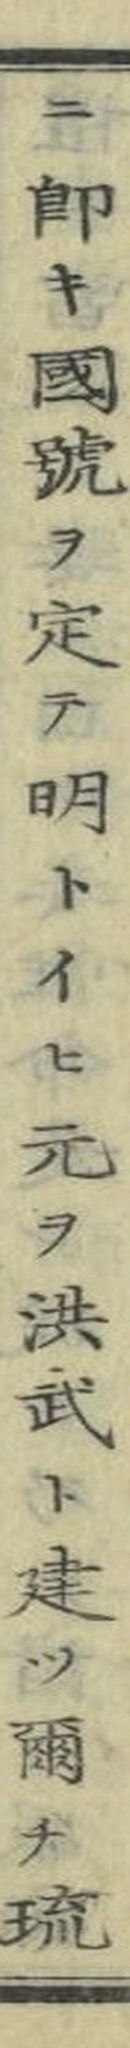ニ即キ國號ヲ定テ明トイヒ元ヲ洪武ト建ツ爾チ琉
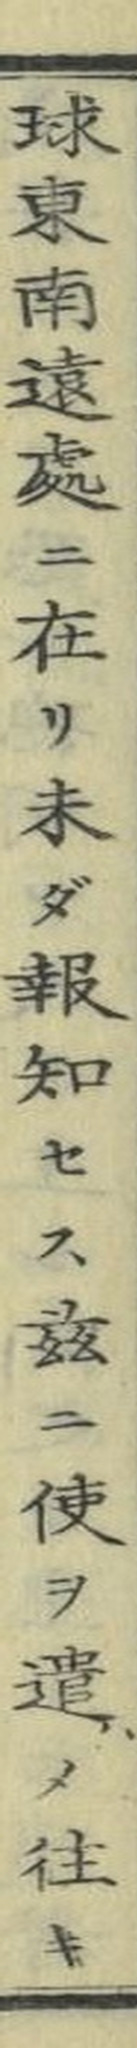球東南遠處ニ在リ未ダ報知セス兹ニ使ヲ遣シテ往キ
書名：琉球藩史 一之巻
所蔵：University of the Ryukyus Library
